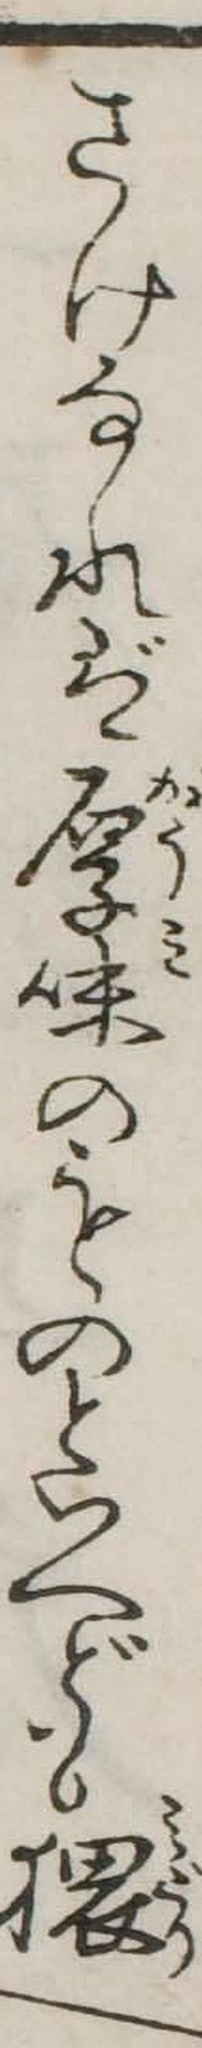さけなれば厚味のものといへども猥
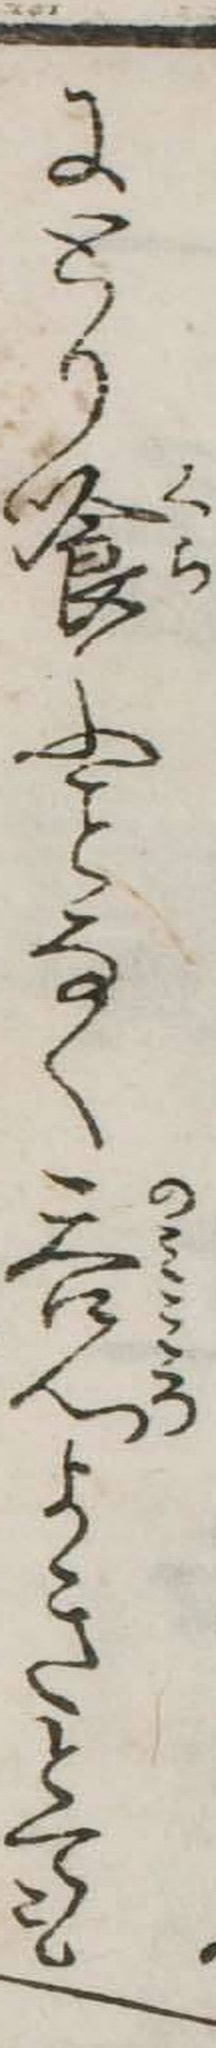にとり喰ふことなく呑心よきとても
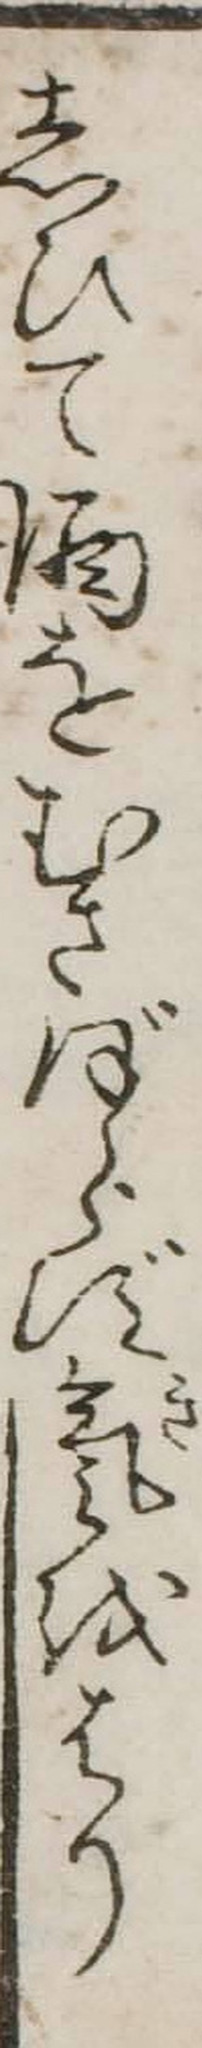しひて酒をむさぼらず気をはり
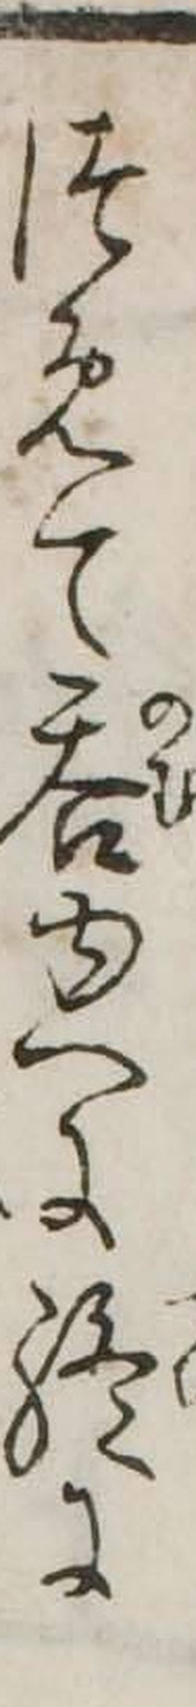つめて呑ゆへに終に
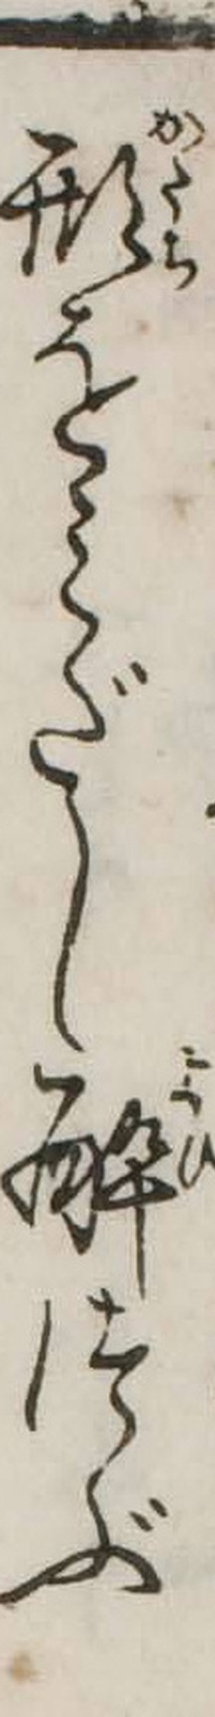形をみだし酔つぶ
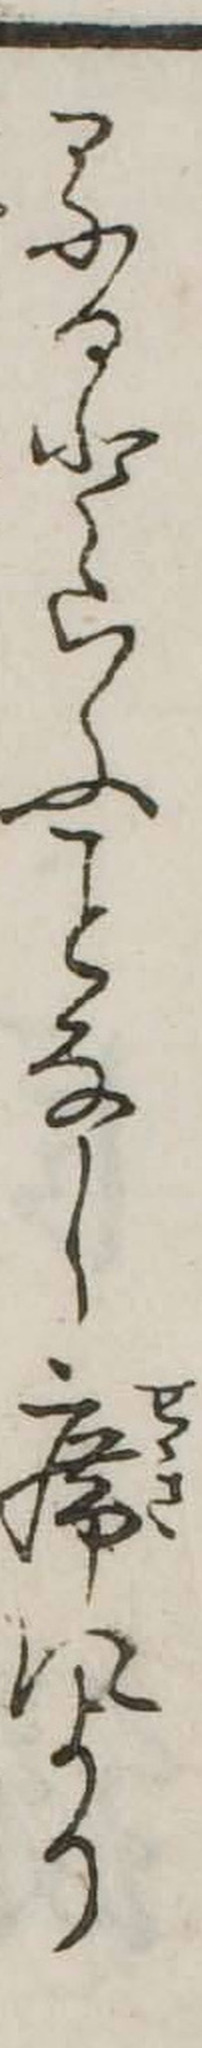るるといふことなし席により
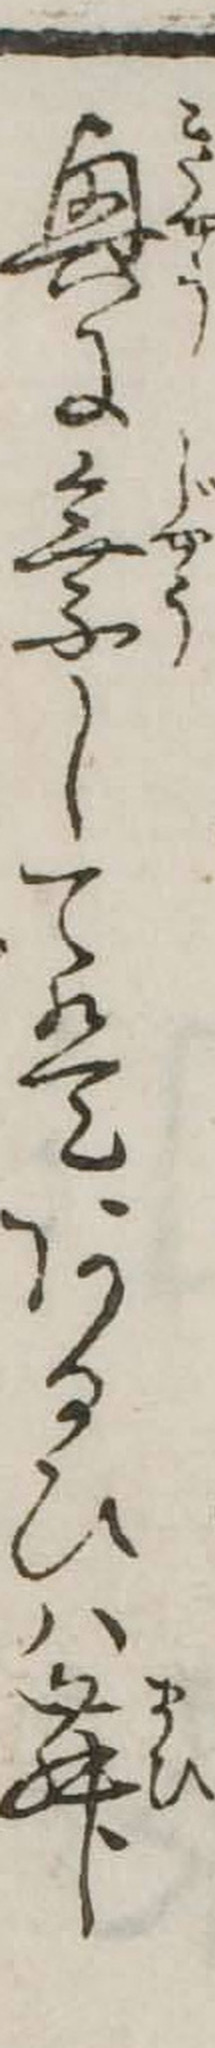興に乗してはあるひは舞
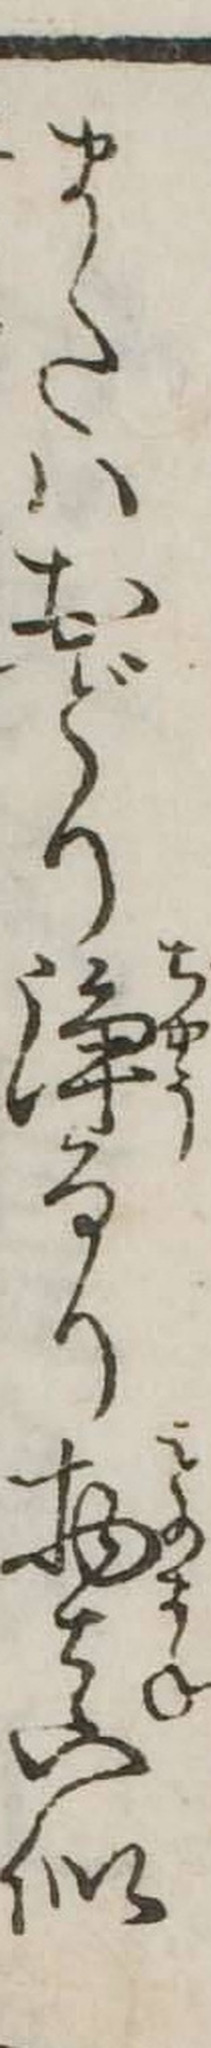またはおどり浄るり物真似
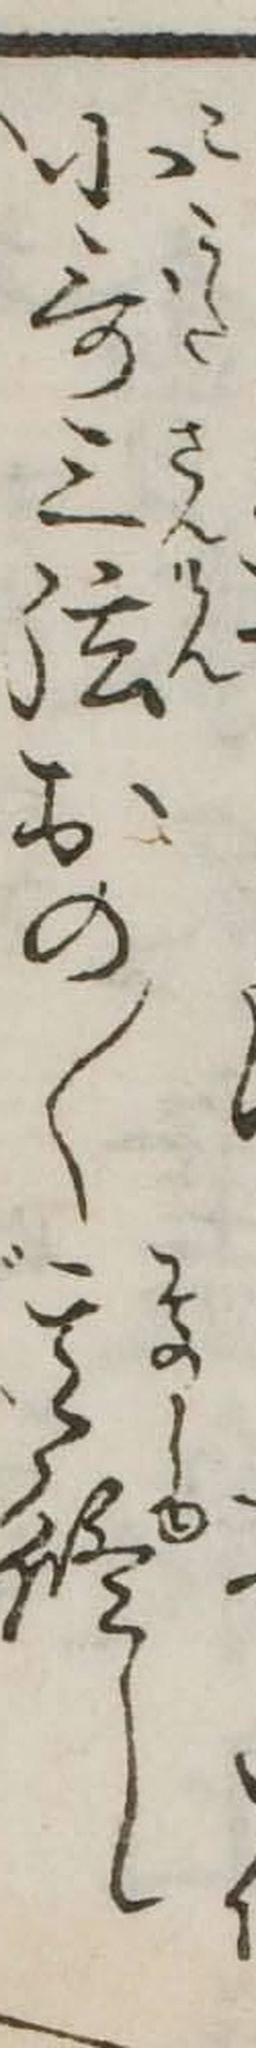小歌三弦おの〳〵其修し
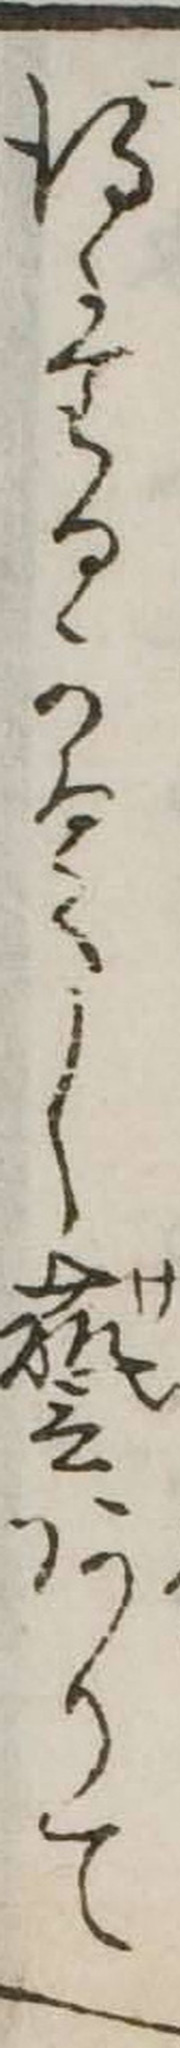得たるかくし芸ありて
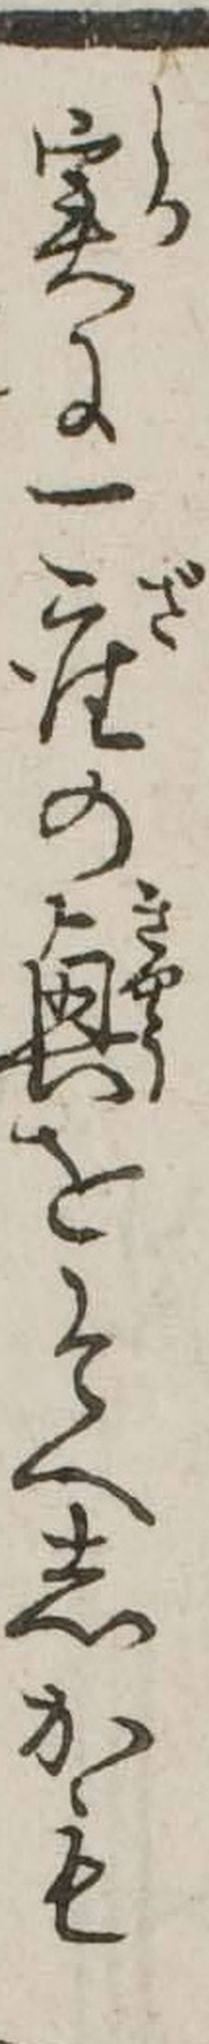実に一座の興をそへしかも
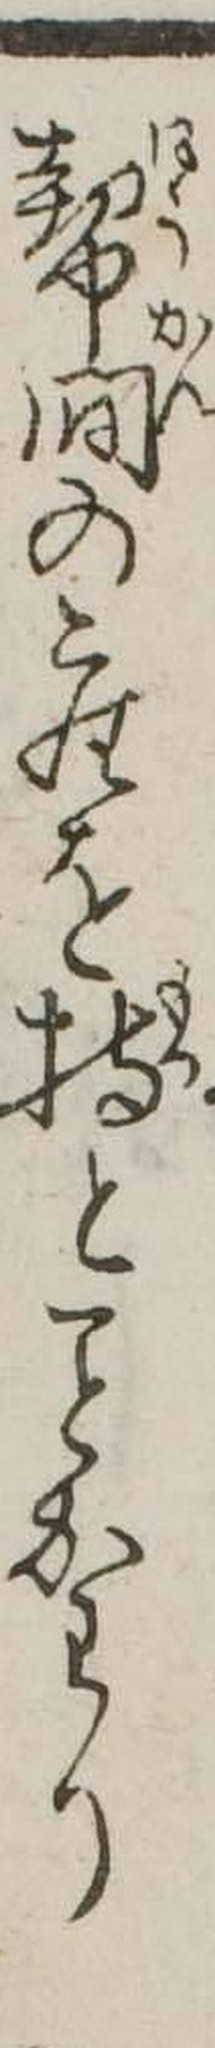幇間の座を持とことかわり
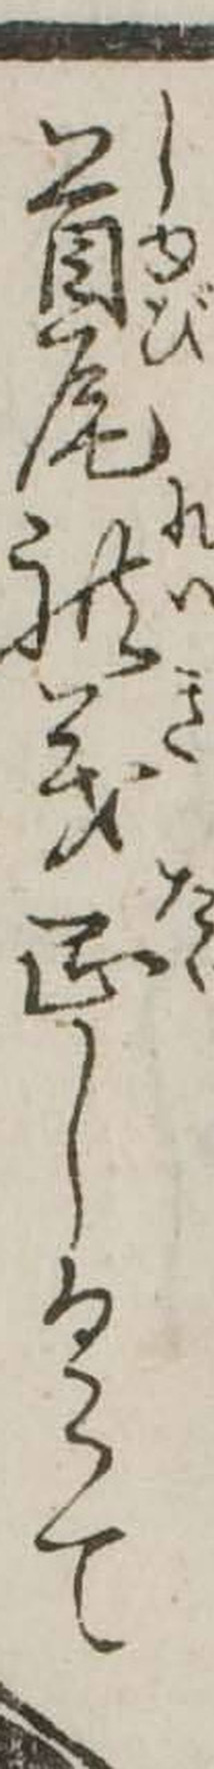首尾礼義正しくて
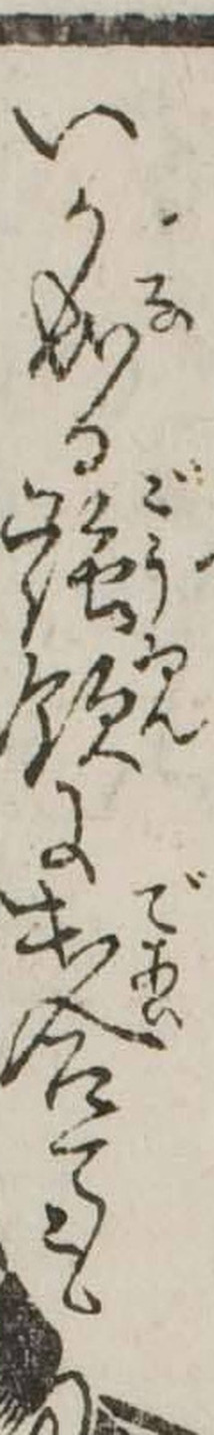いか成る強飲に出会ても
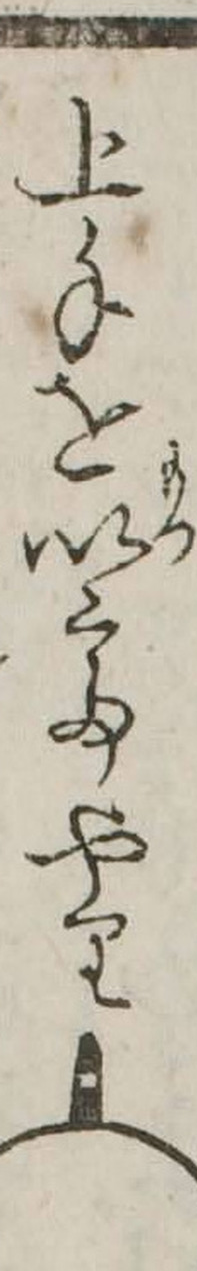上手を以てやり
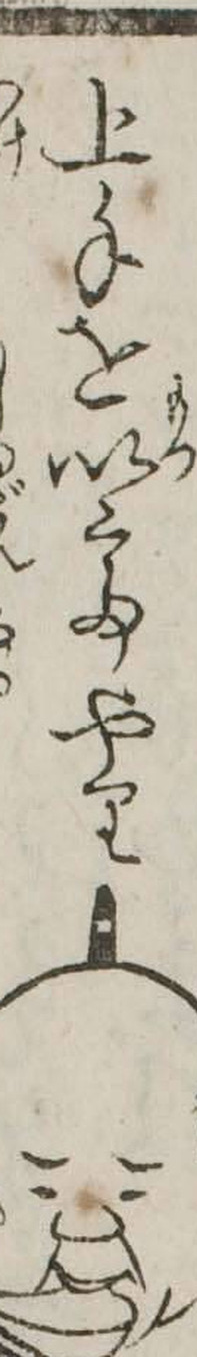上手を以てやり
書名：繪本不盡泉
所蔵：国文学研究資料館
